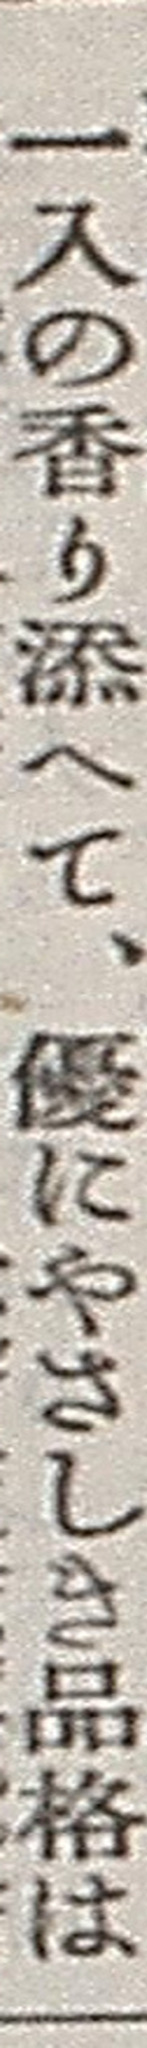一入の香り添へて、優にやさしき品格は
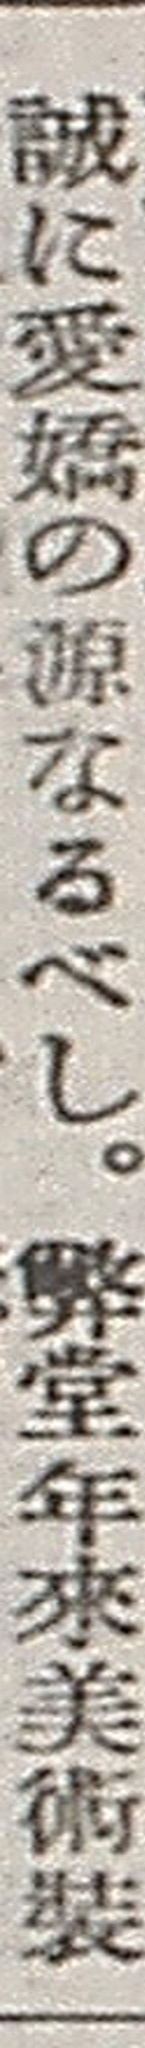誠に愛嬌の源なるべし。弊堂年来美術装
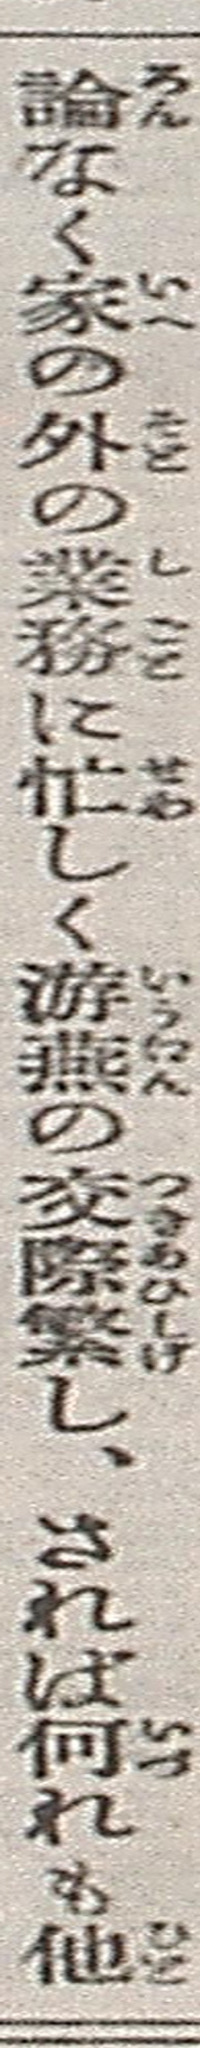論なく家の外の業務に忙しく游燕の交際繁し、されば何れも他
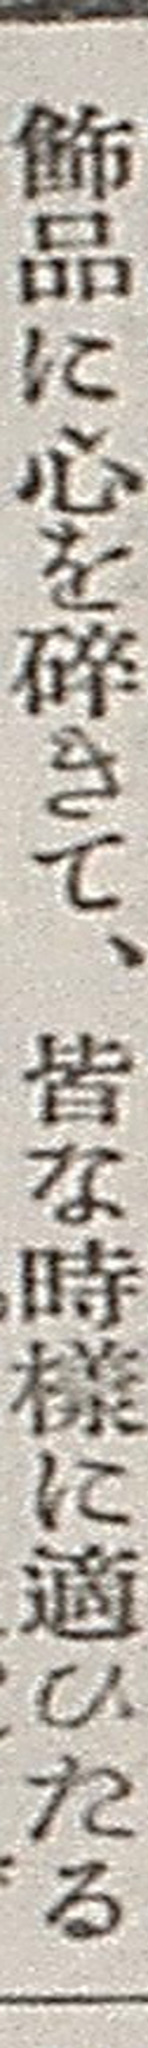飾品に心を砕きて、皆な時様に適ひたる
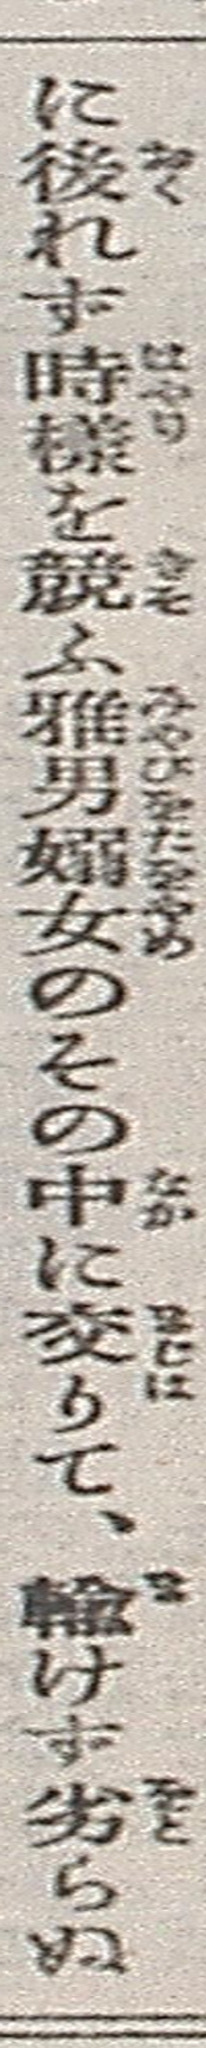に後れず時様を競ふ雅男嫋女のその中に交りて、輸けず劣らぬ
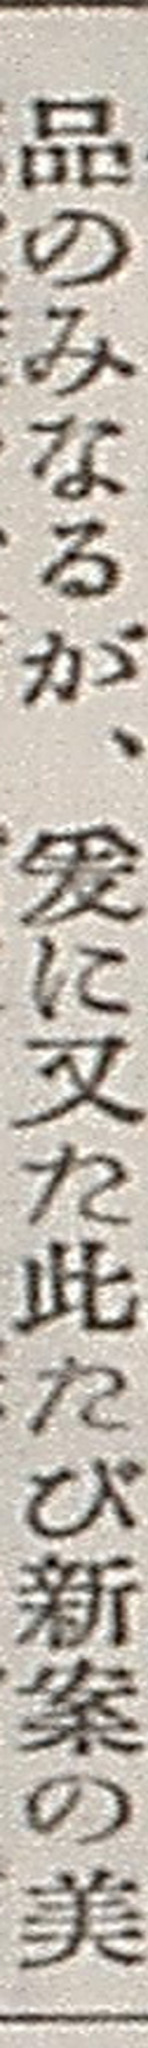品のみなるが、爰に又た此たび新案の美
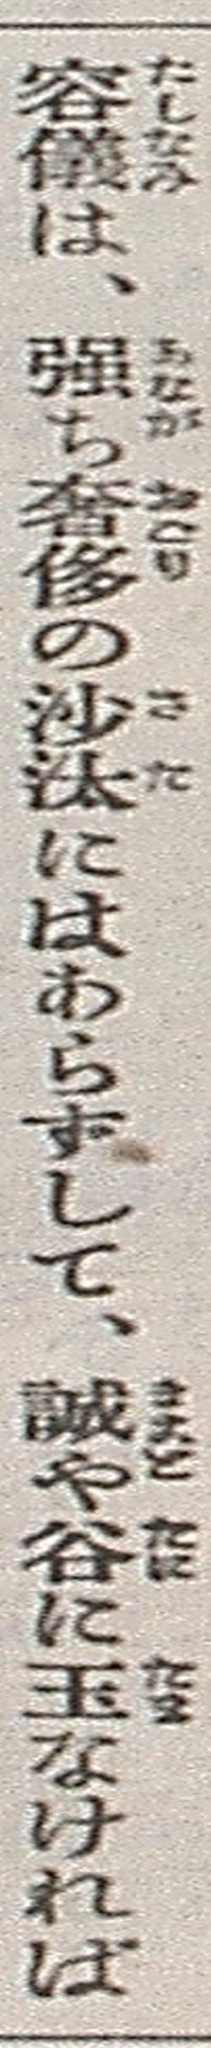容儀は、強ち奢侈の沙汰にはあらずして、誠や谷に玉なければ
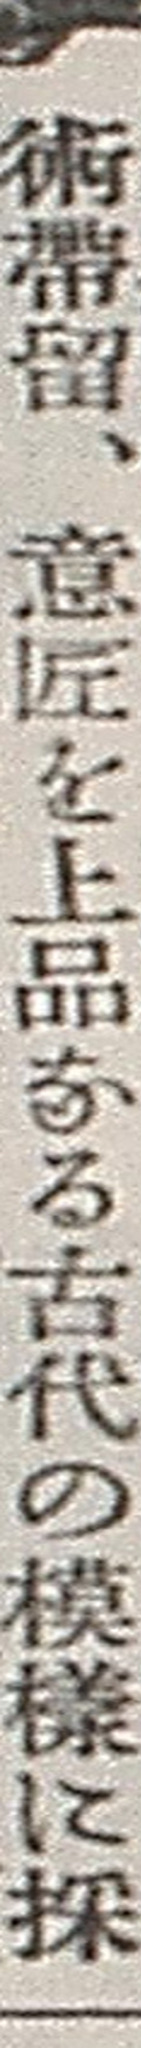術帯留、意匠を上品なる古代の模様に採
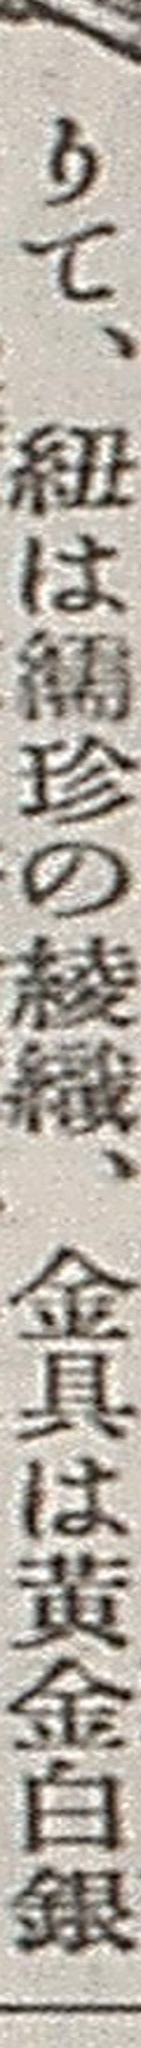りて、紐は繻珍の綾織、金具は黄金白銀
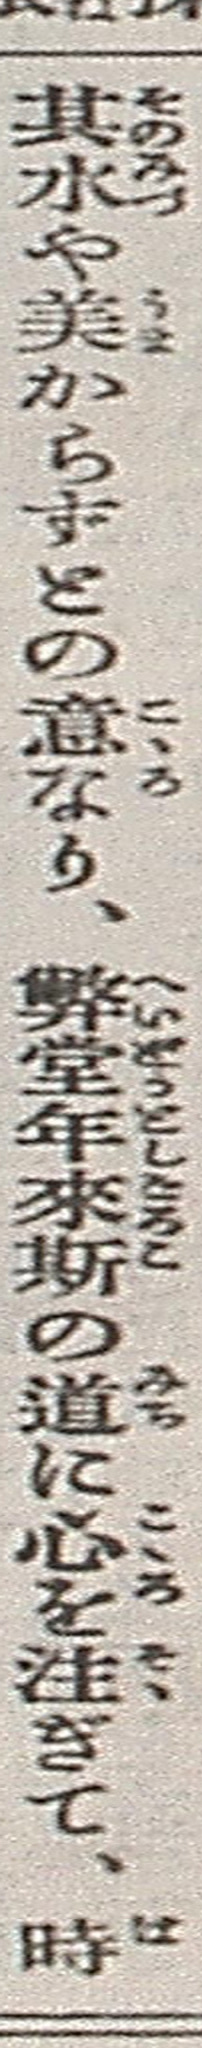其水や美からずとの意なり、弊堂年来斯の道に心を注ぎて、時
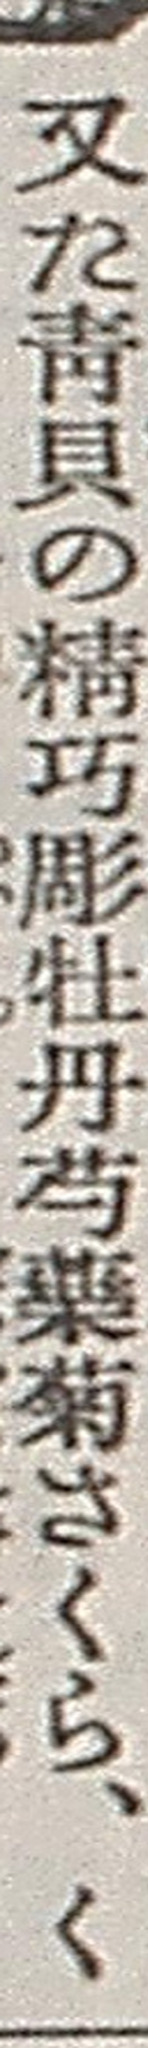又た青貝の精巧彫牡丹芍薬菊さくら、く
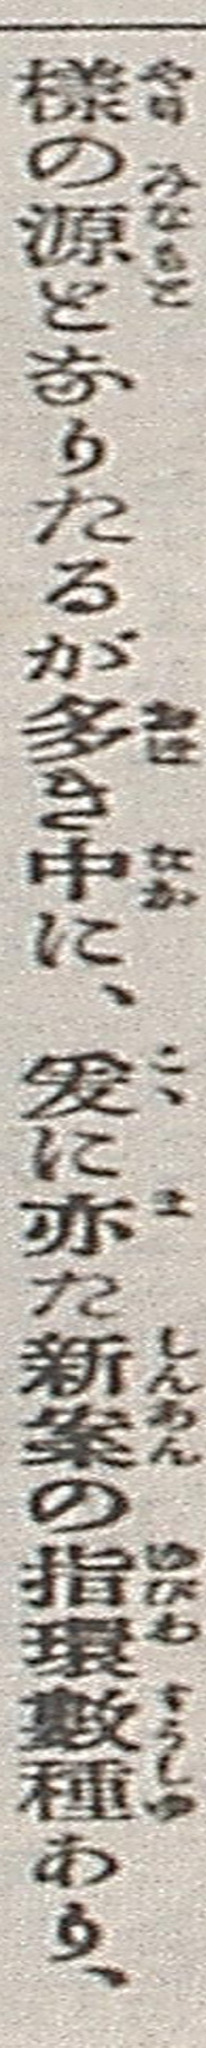様の源となりたるが多き中に、爰に亦た新案の指環数種あり、
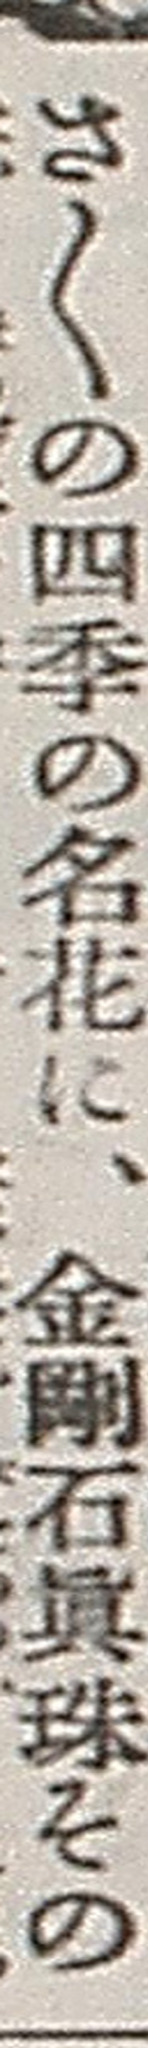さ〳〵の四季の名花に、金剛石真珠その
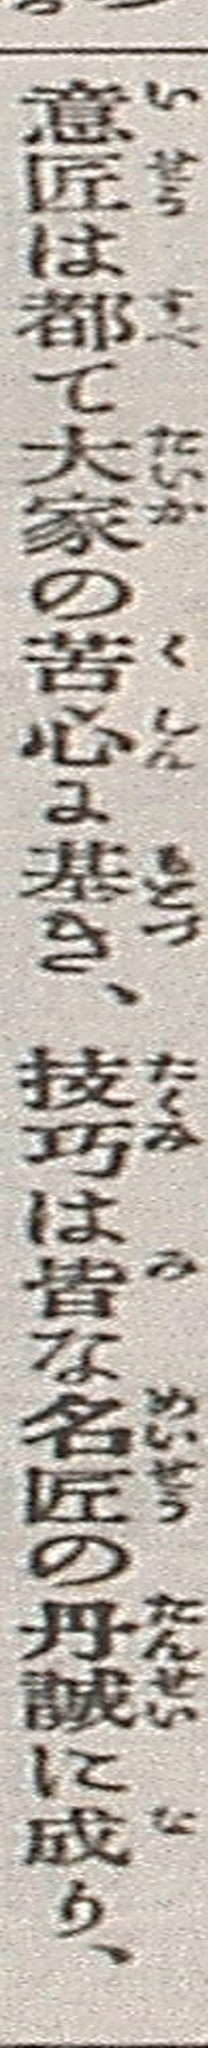意匠は都て大家の苦心に基き、技巧は皆な名匠の丹誠に成り、
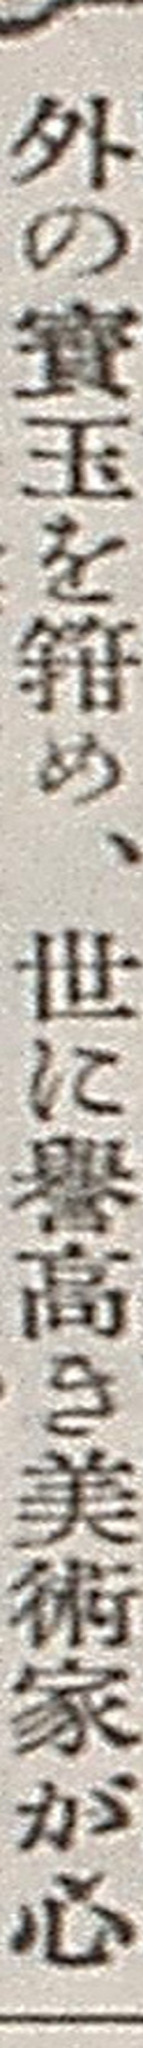外の宝玉を箝め、世に誉高き美術家が心
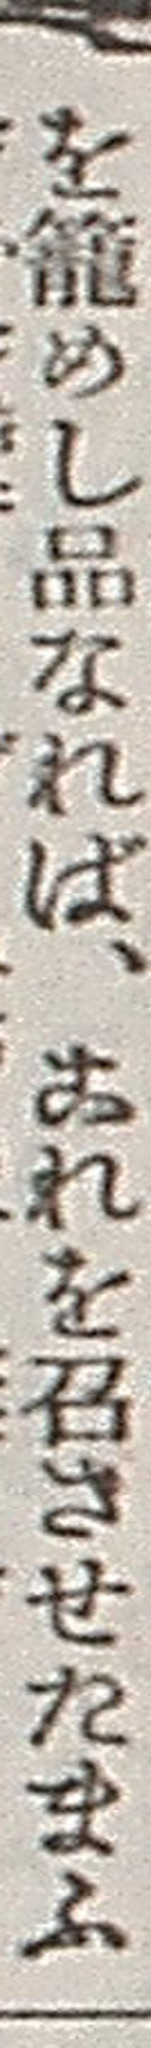を籠めし品なれば、これを召させたまふ
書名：風俗畫報臨時増刊第百十九號　大海嘯被害録（中）
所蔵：東京大学地震研究所図書室 Earthquake Research Institute Library, The University of Tokyo, JAPAN
